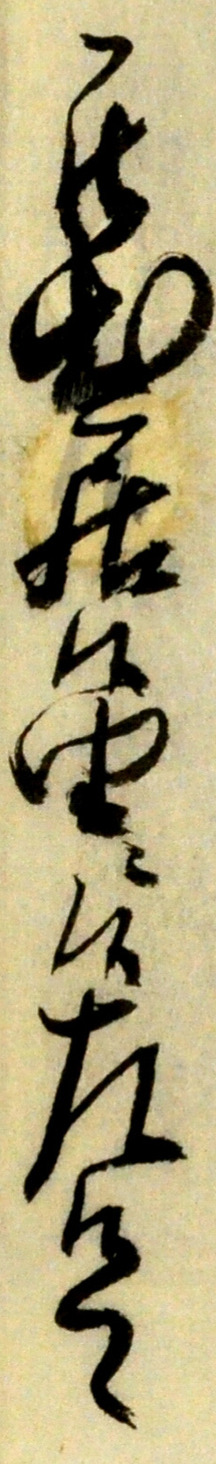罷出居候由に候左候はゝ
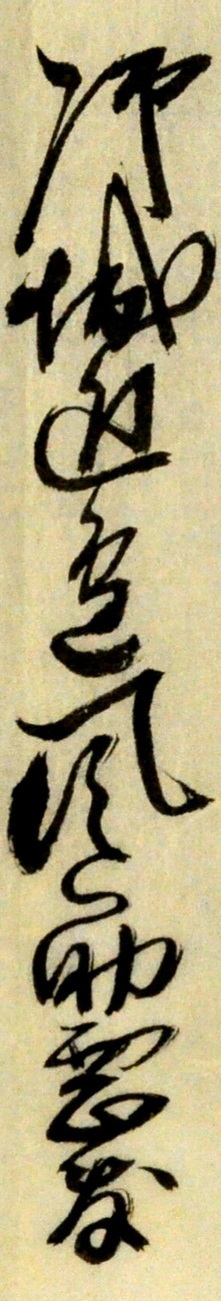御城近辺風筋悪敷
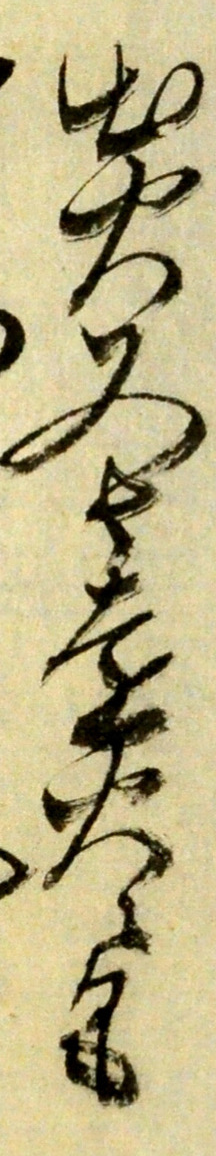出火又は遠火にても
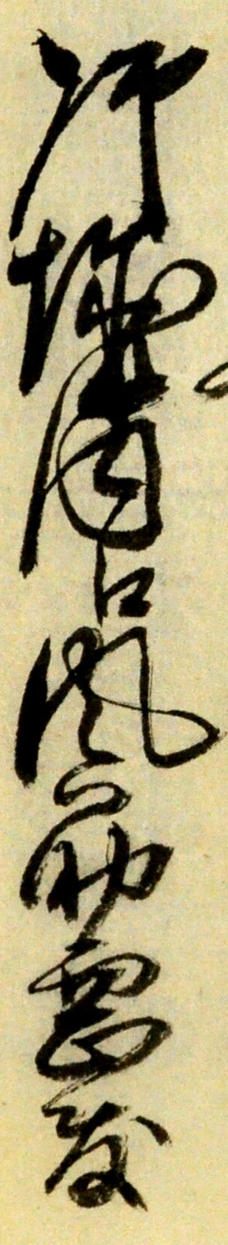御城内え風筋悪敷
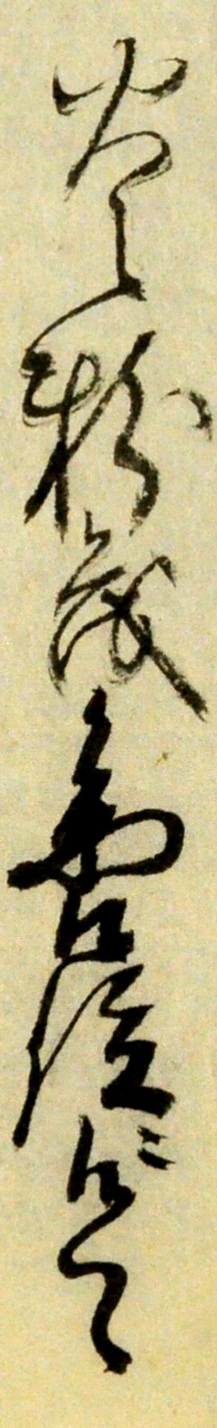火之粉も参候位に候はゝ

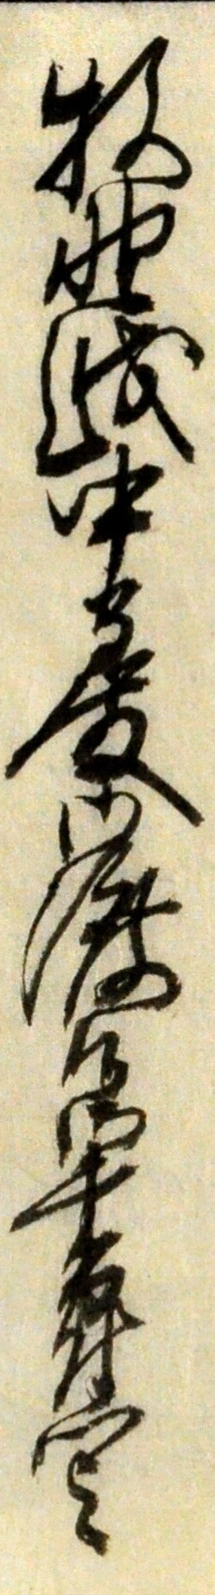牧野越中守殿御渡候御書付写
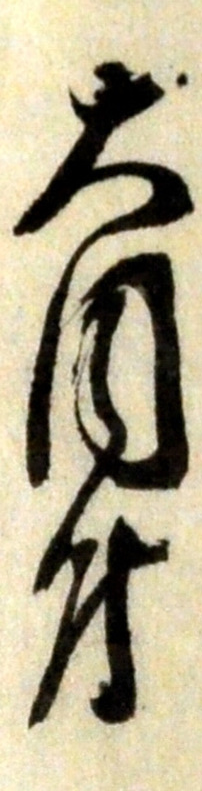大目付

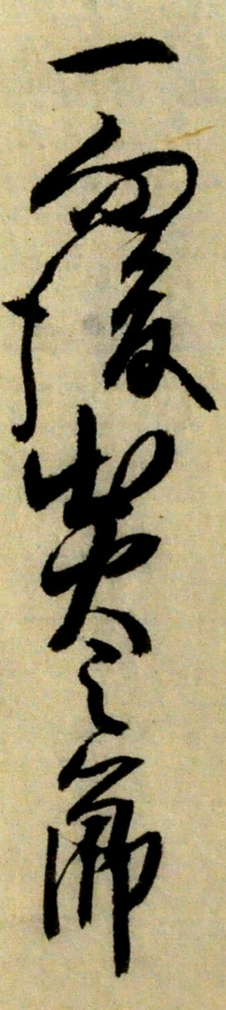一向後出火之節
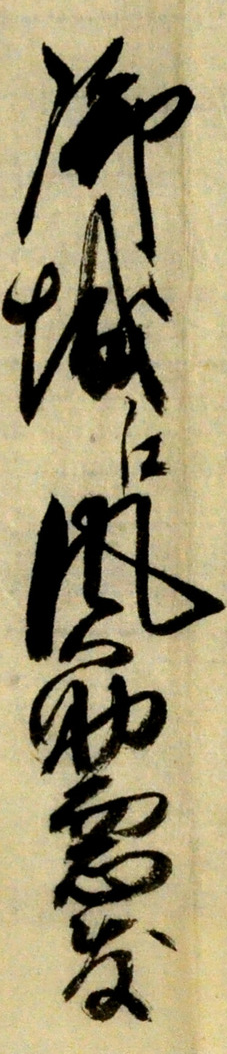御城え風筋悪敷
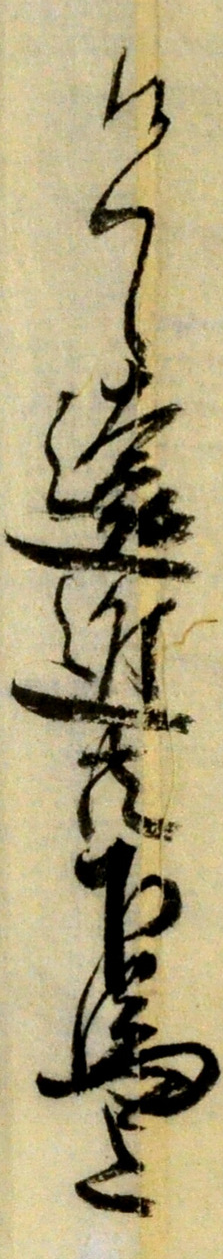候はゝ遠近共下馬迄
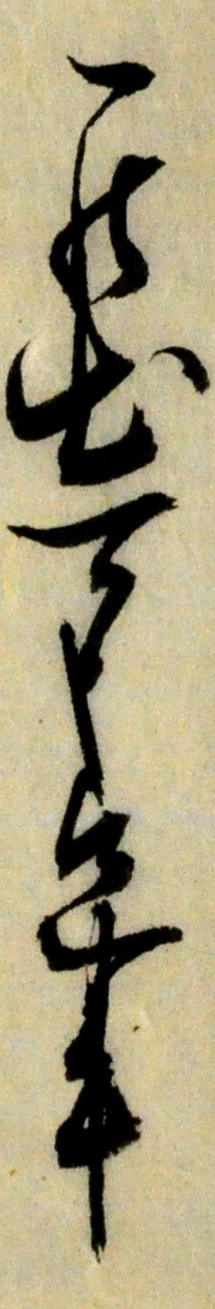罷出可申候事
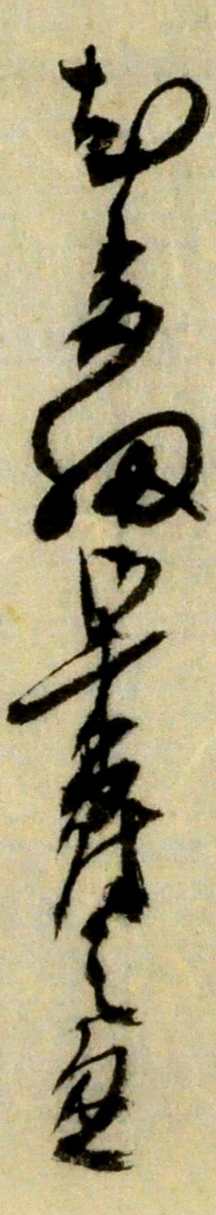尤委細御書付之通
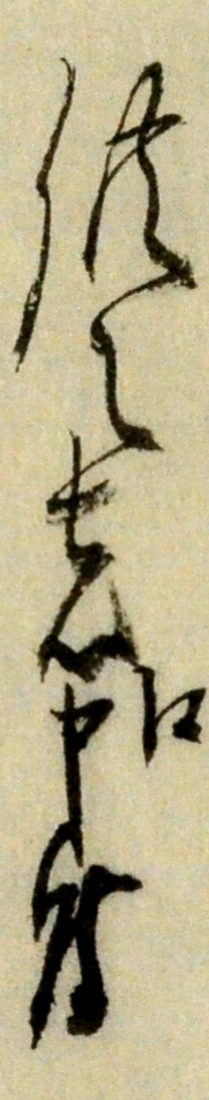供之者え申付
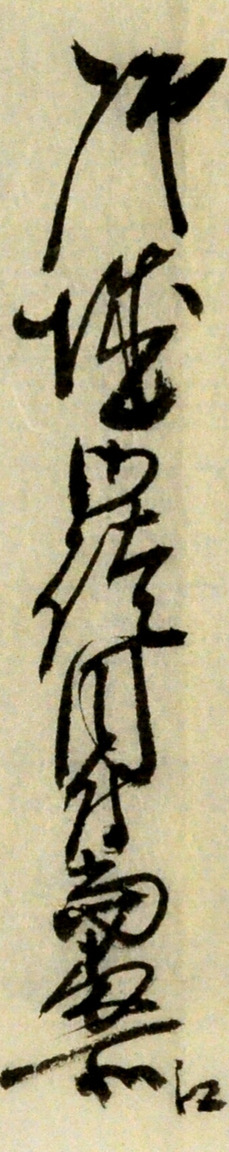御城御徒目付当番所え
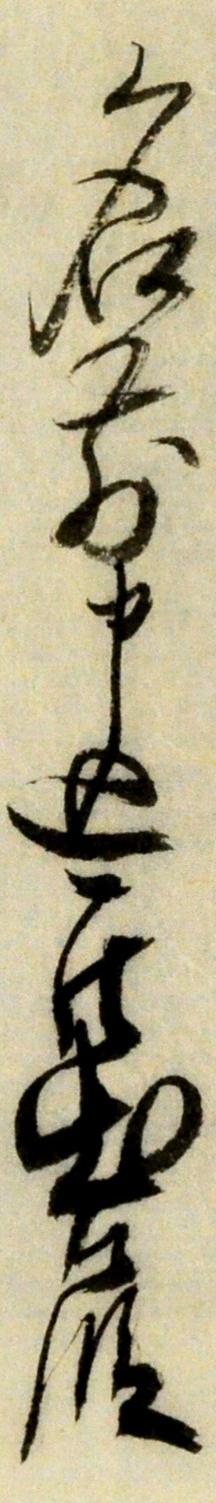名前申込罷出候段
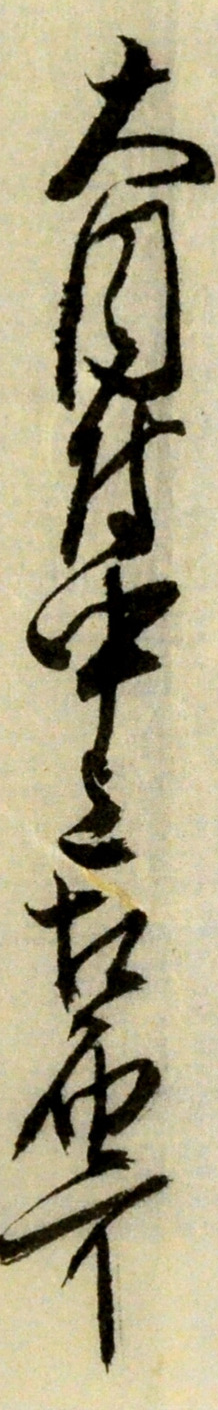大目付中迄相届可
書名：申合帳〔一括〕
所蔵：伊那市立高遠町図書館・合同会社AMANE
